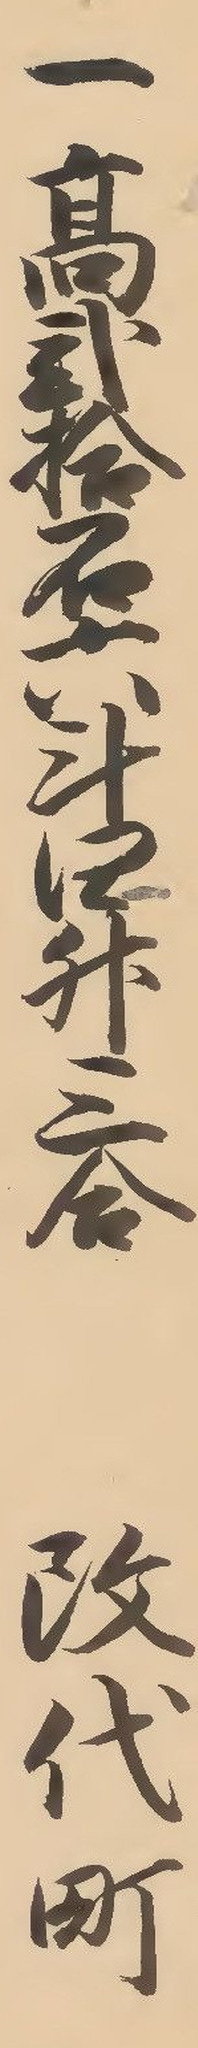一高弐拾石六斗四升三合改代町
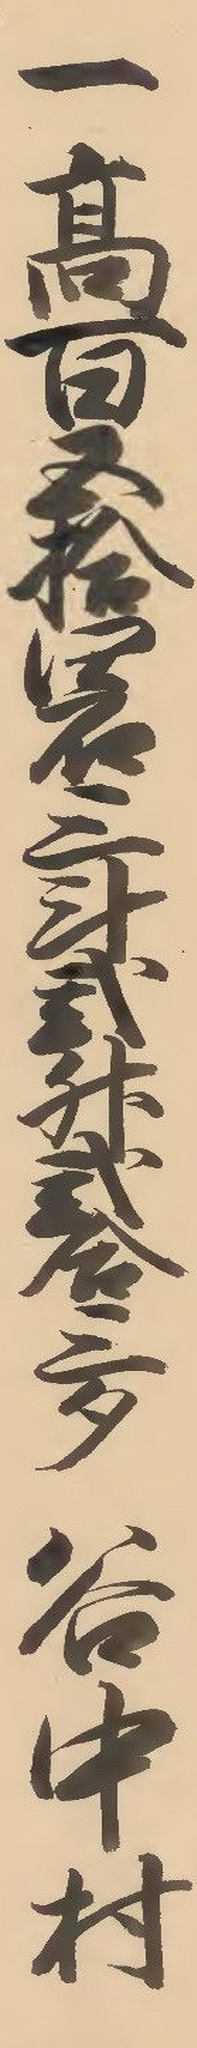一高百五拾四石三斗弐升弐合三勺谷中村
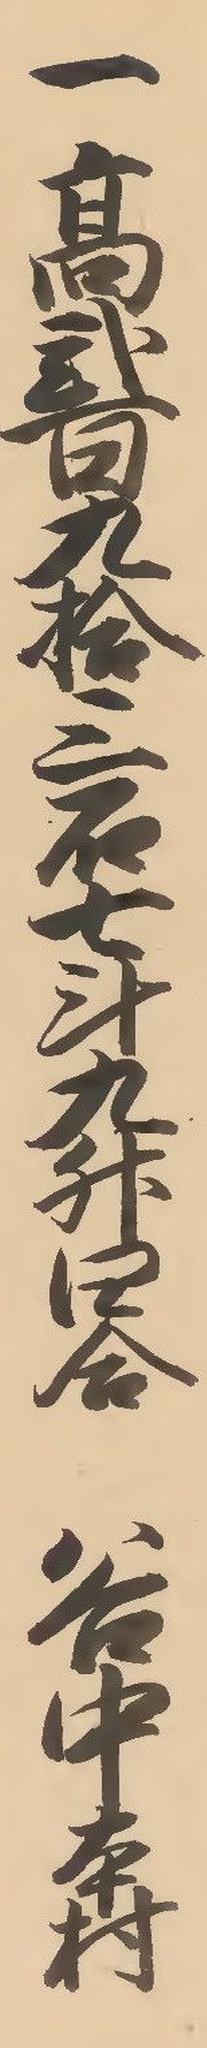一高弐百九拾三石七斗九升四合谷中本村
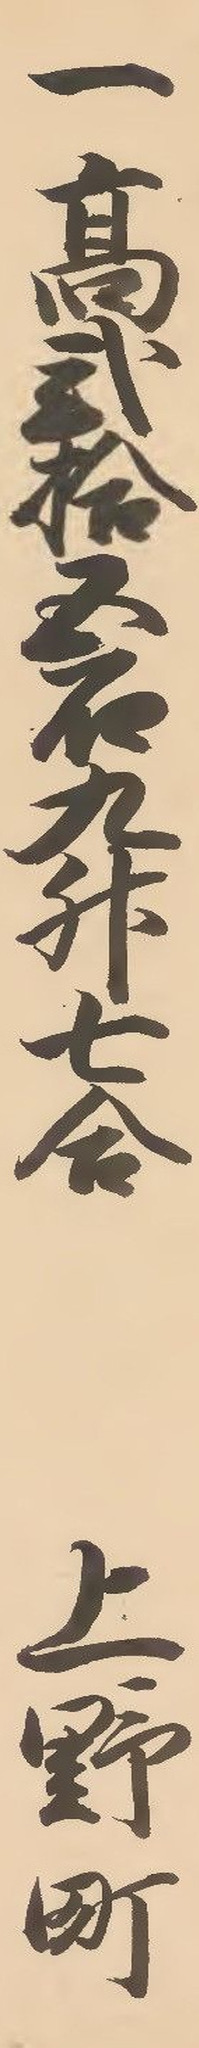一高弐拾五石九升七合上野町
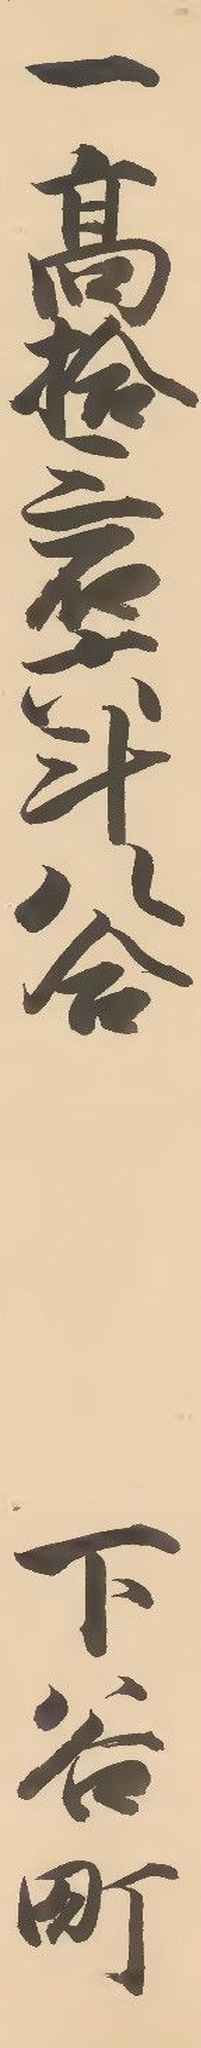一高拾三石六斗八合下谷町
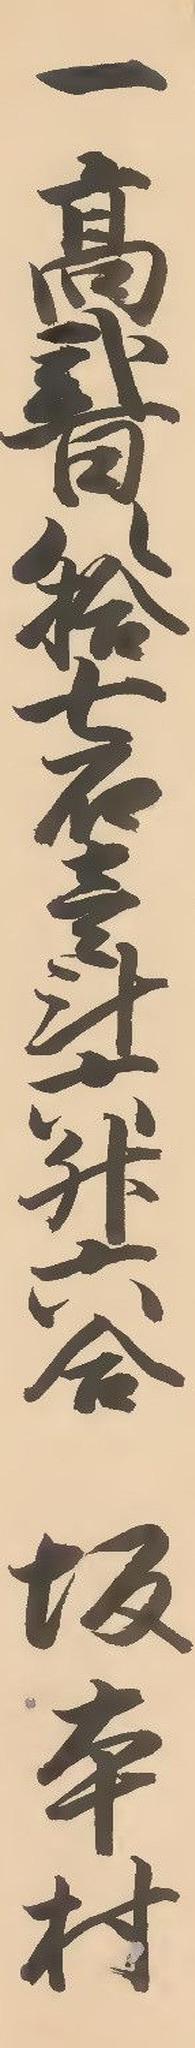一高弐百八拾七石壱斗六升六合坂本村
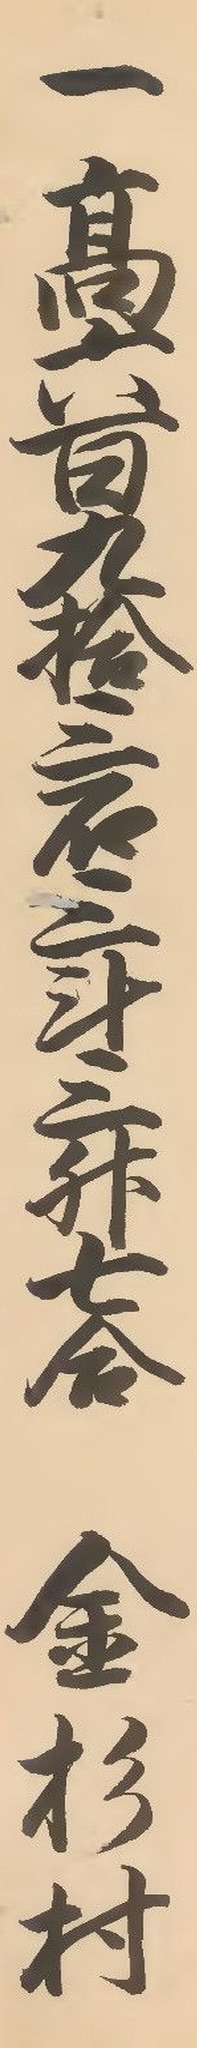一高六百九拾三石三斗三升七合金杉村

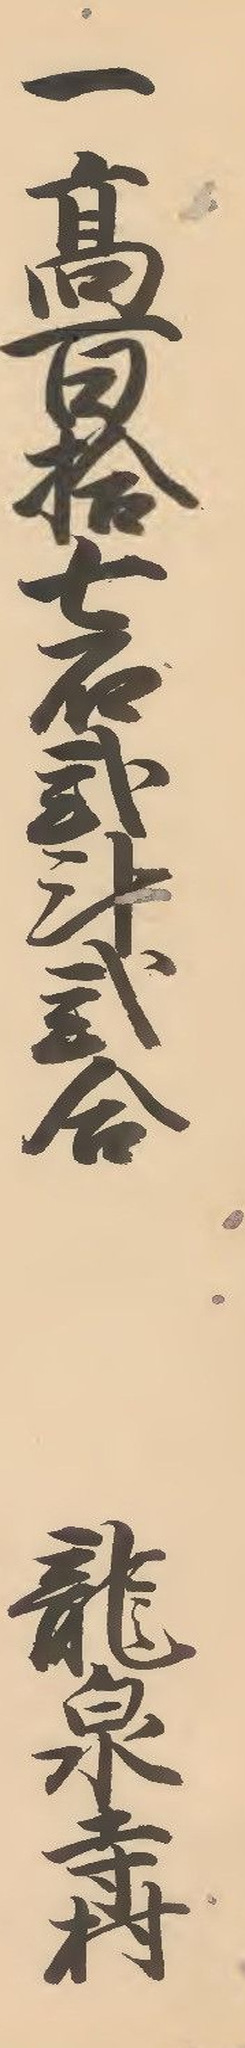一高百拾七石弐斗弐合龍泉寺村
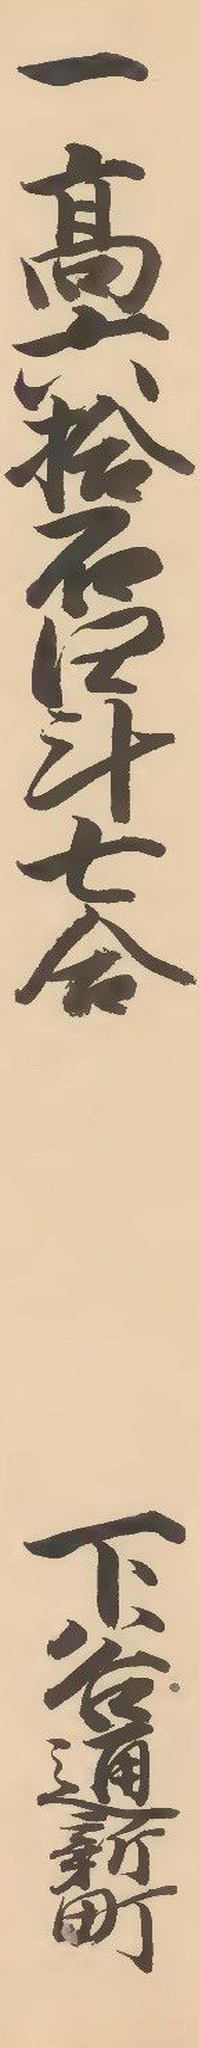一高六拾石四斗七合下谷通新町
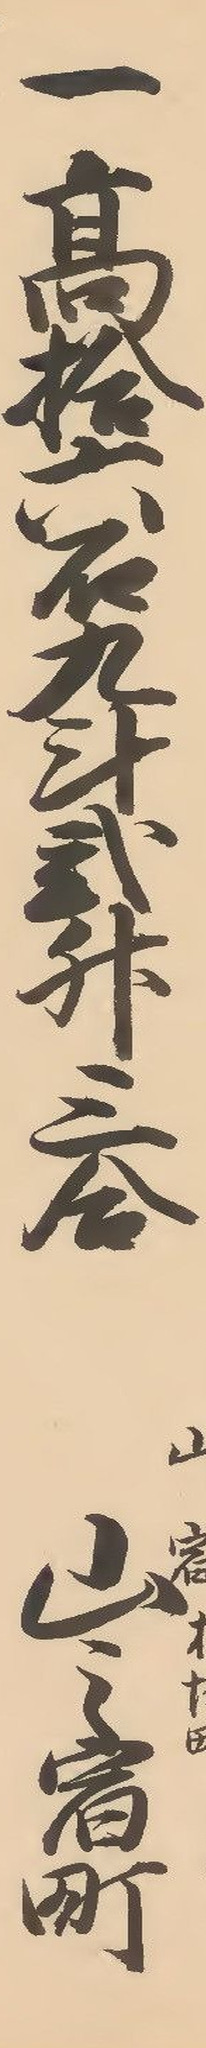一高拾六石九斗弐升三合山之宿町
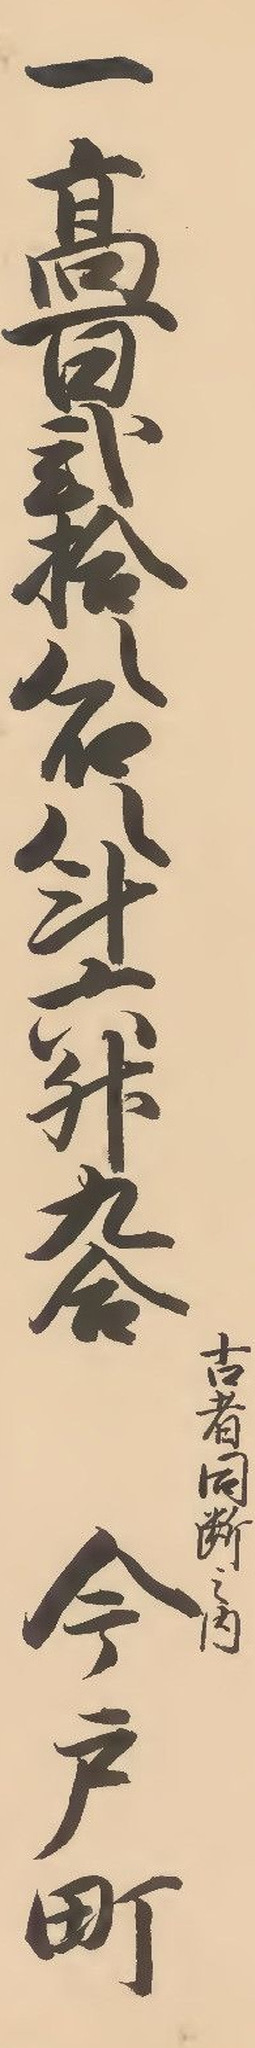一高百弐拾八石八斗六升九合今戸町
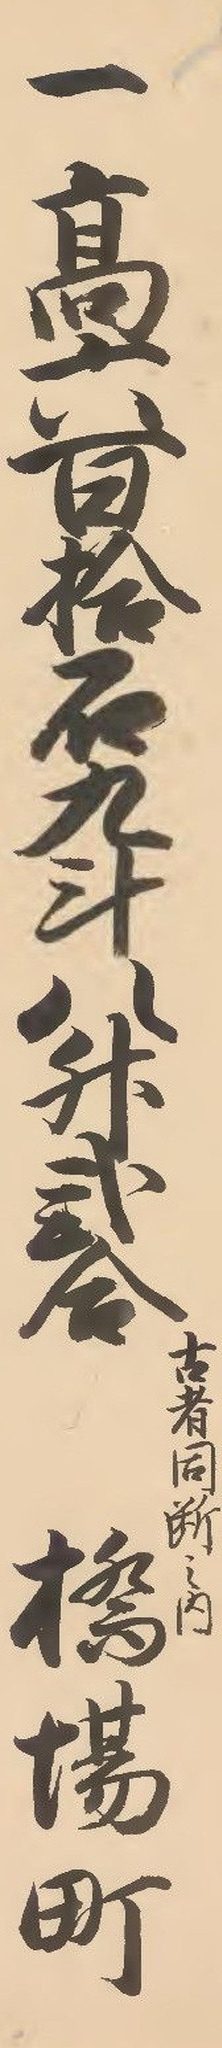一高六百拾石九斗八升弐合橋場町
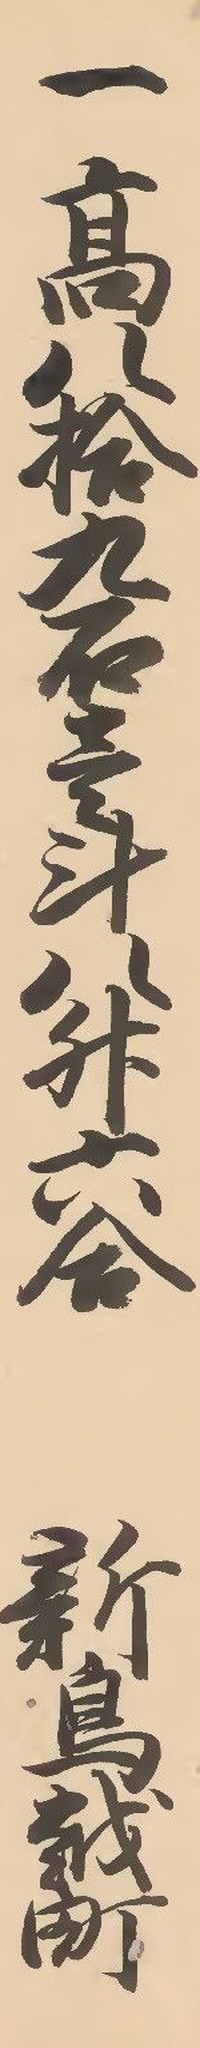一高八拾九石壱斗八升六合新鳥越町
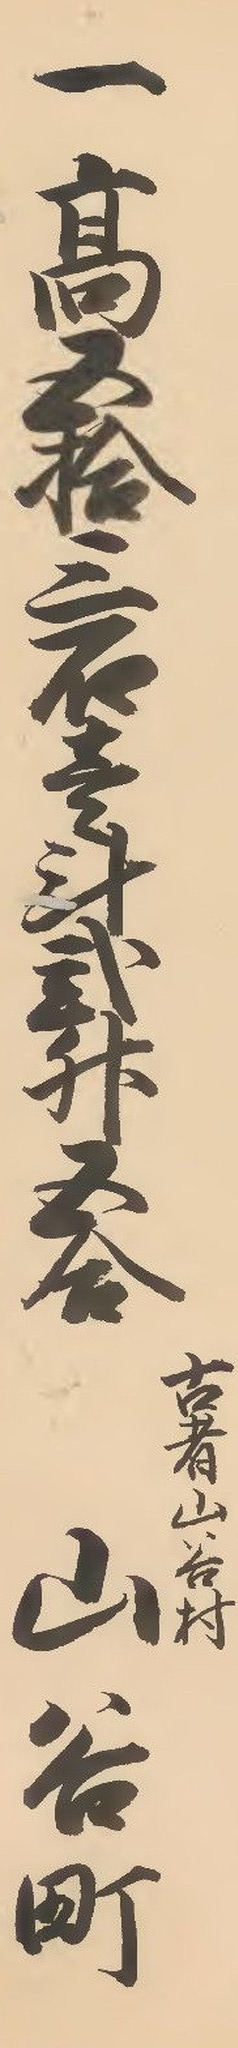一高五拾三石壱斗弐升五合山谷町

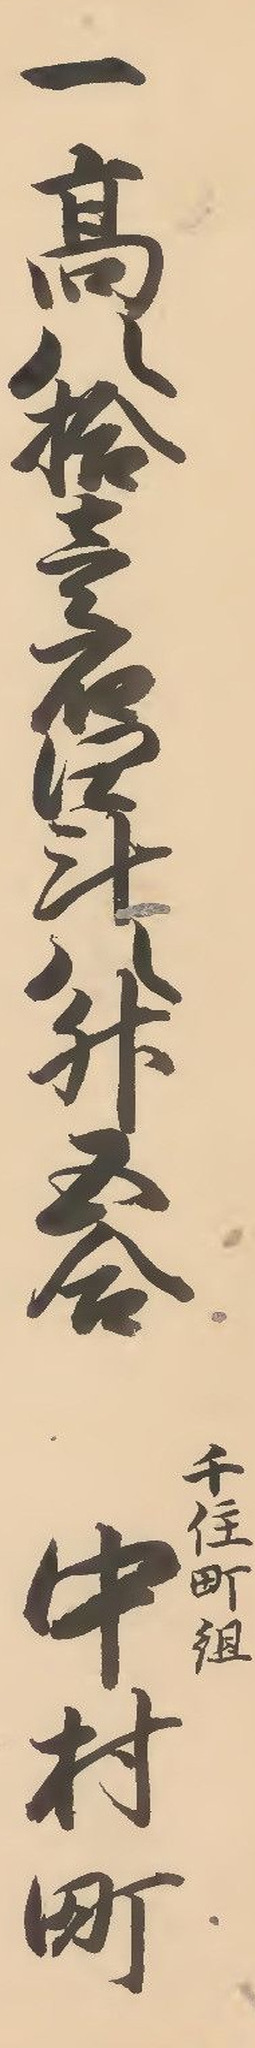一高八拾壱石四斗八升五合中村町
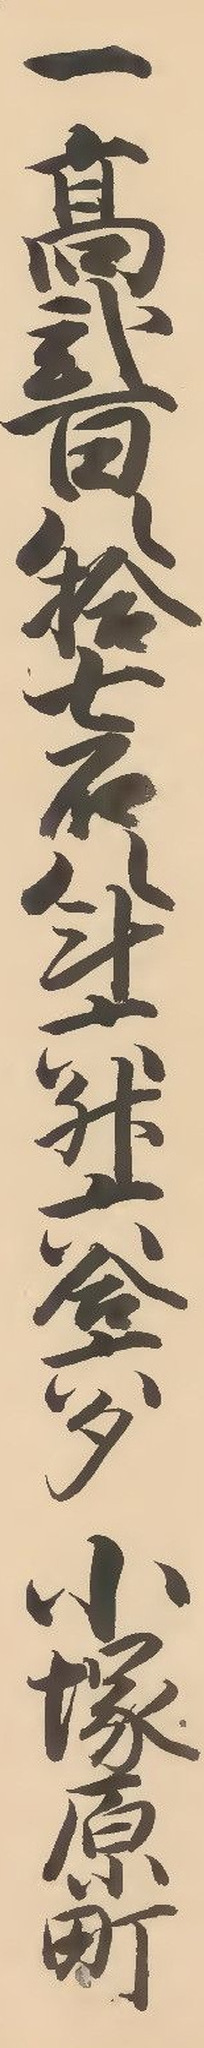一高弐百八拾七石八斗六升六合六勺小塚原町
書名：武蔵国郷帳　上
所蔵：国立公文書館 National Archives of Japan
